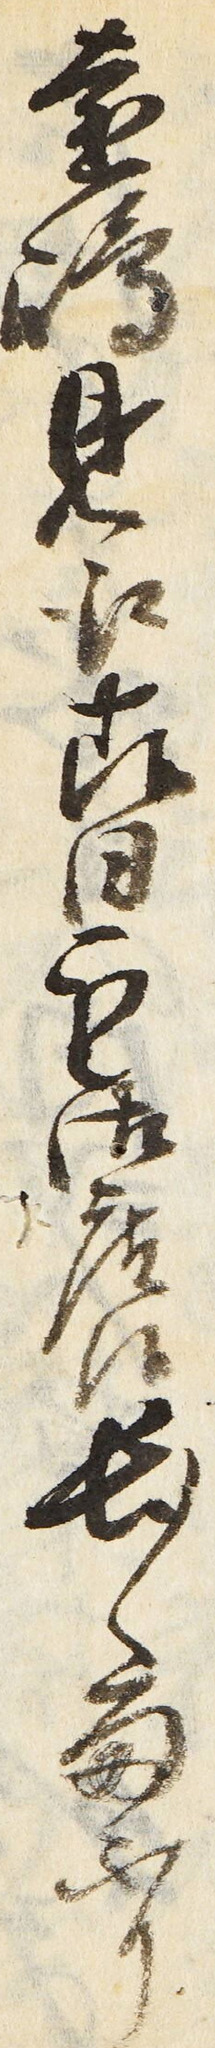遠島見江申候日も御座候長く雨ふり
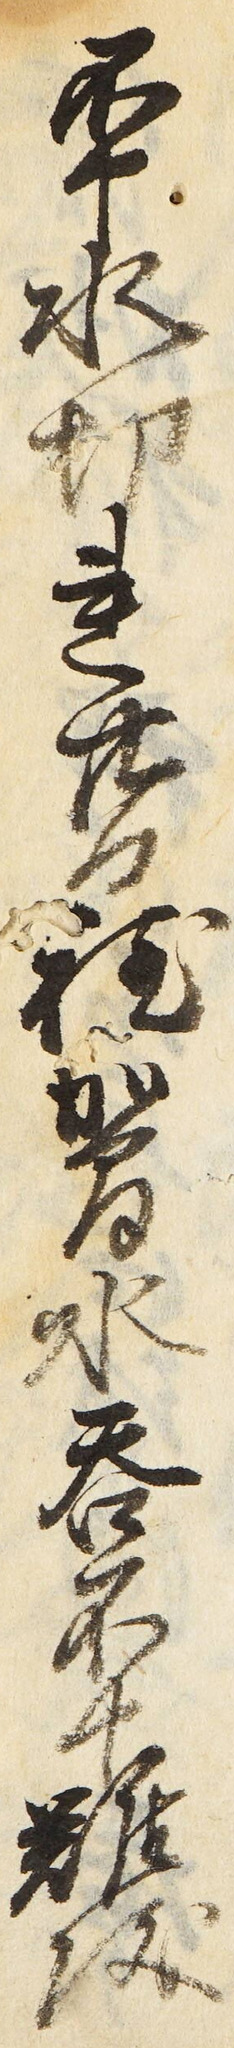不申水切れ廿日程が間水呑不申難儀

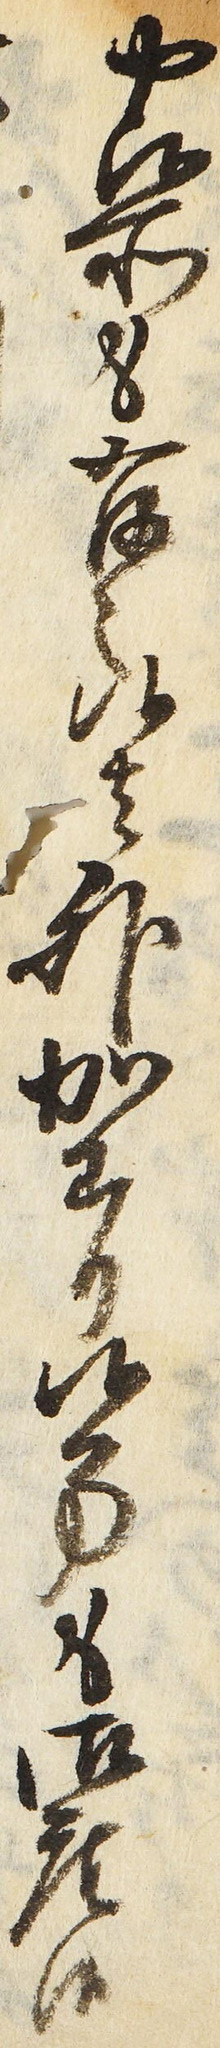申候所も有之候は外かわり候事も御座候
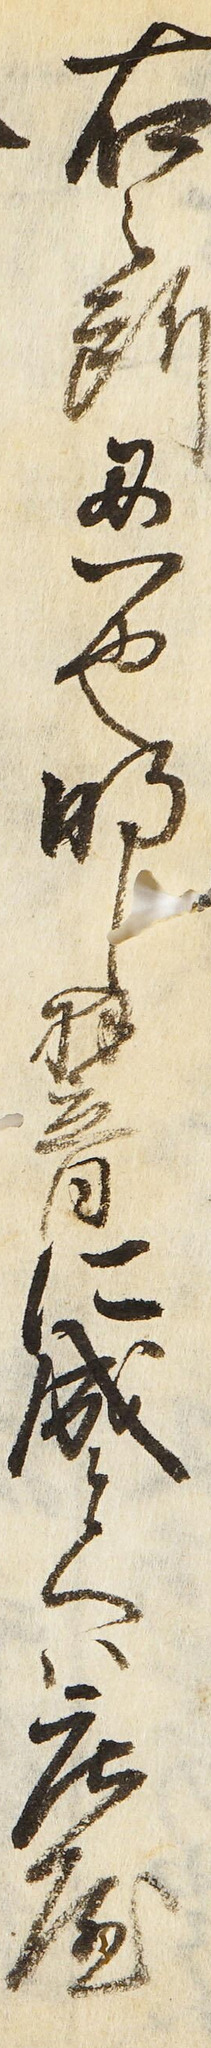右之所に一や明し翌日に成候へハ庄屋
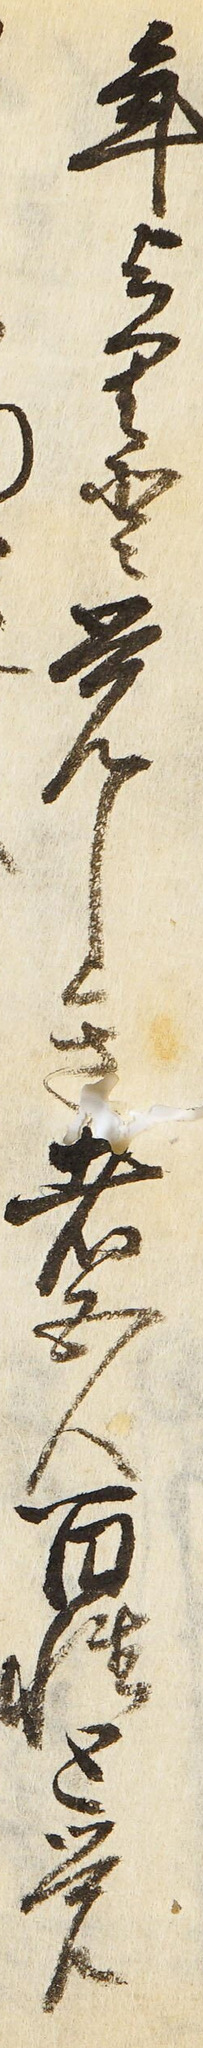年よりと覚しき者五人百性と覚
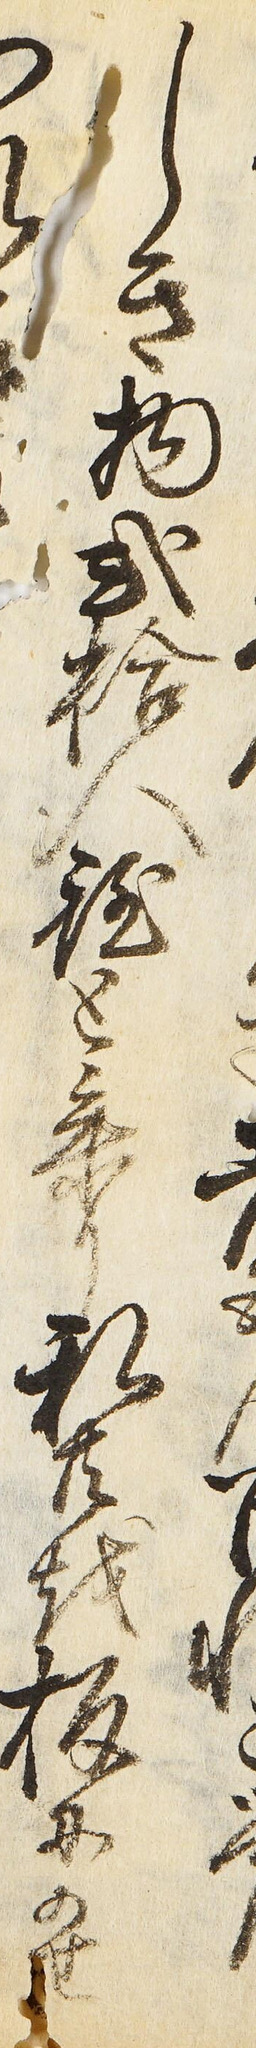しき物弐拾人程と参り私共を板にのせ
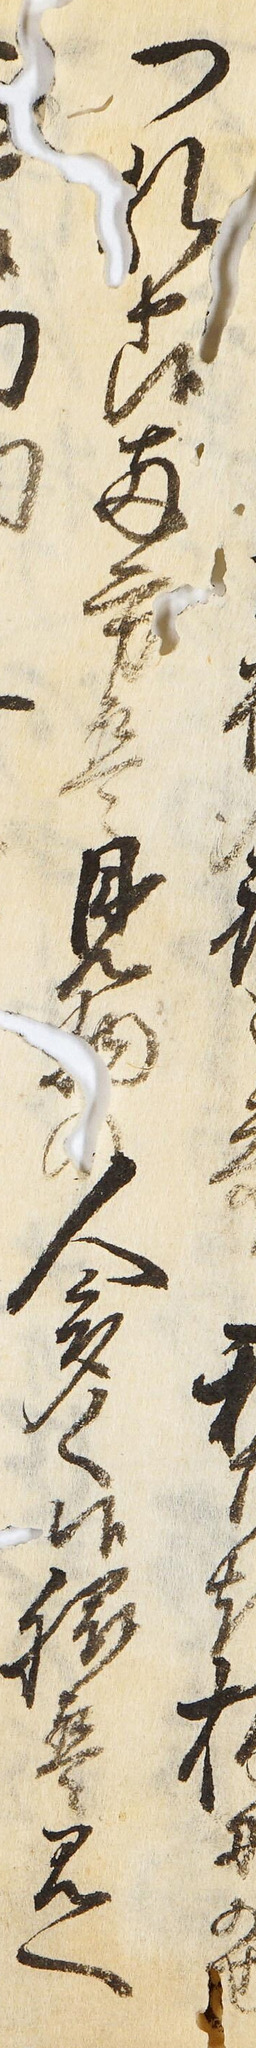つれ申候両方は見物の人多く候脇は見へ
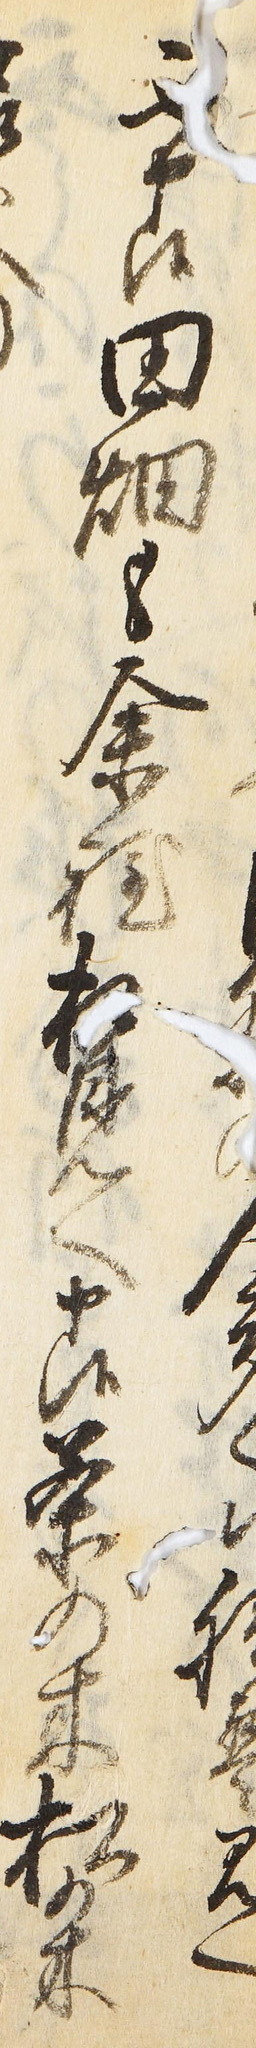不申候田畑も余程相見へ申候茶の木松の木
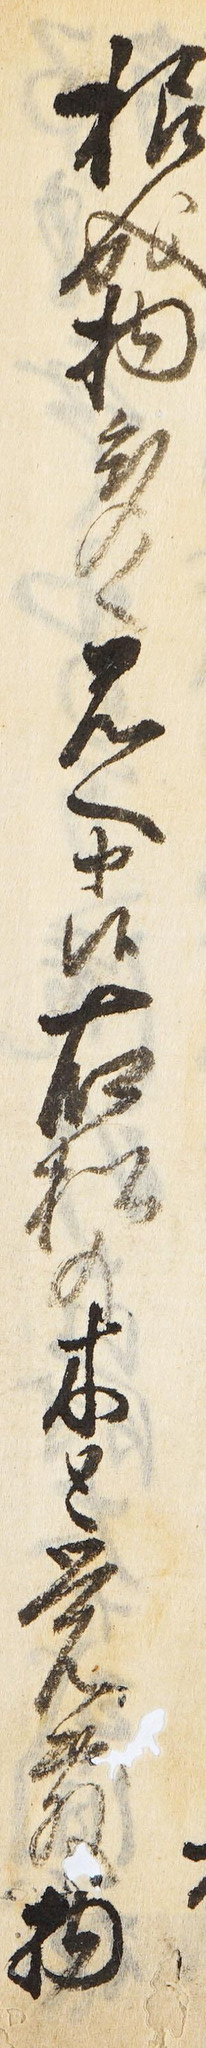様成物多く見へ申候右松の木と覚敷物
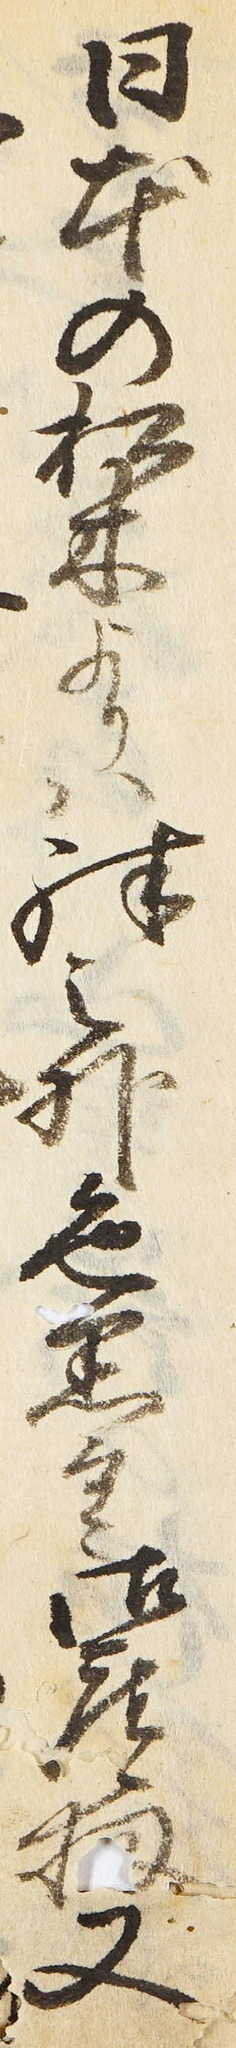日本の松木よりハ殊之外色黒く御座候扨又
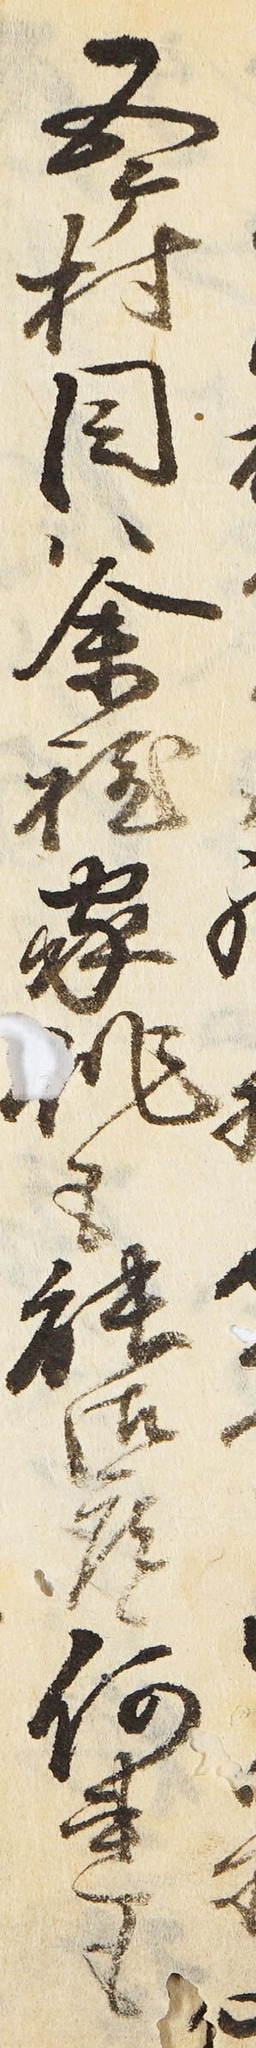五ヶ村目ハ余程家作も能御座候何れも
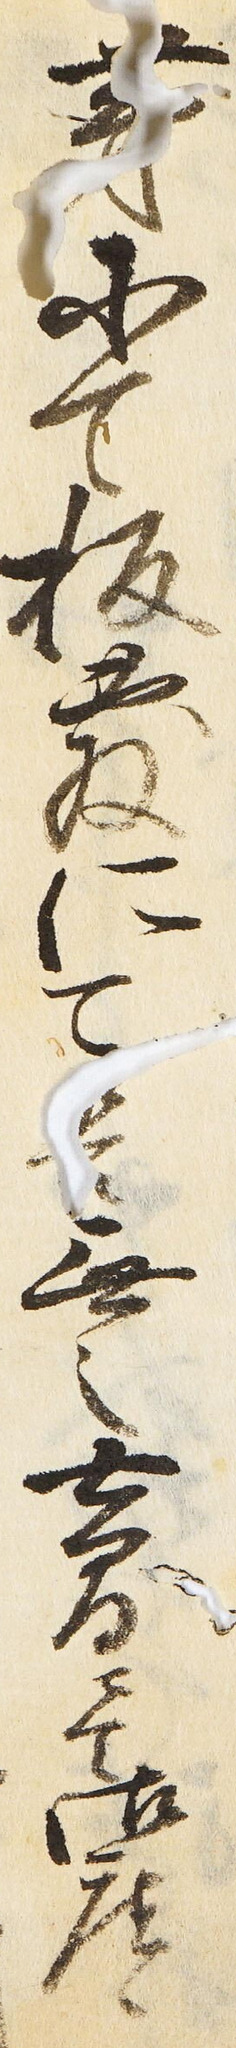茅にて板敷にては無之土間ニて御座候
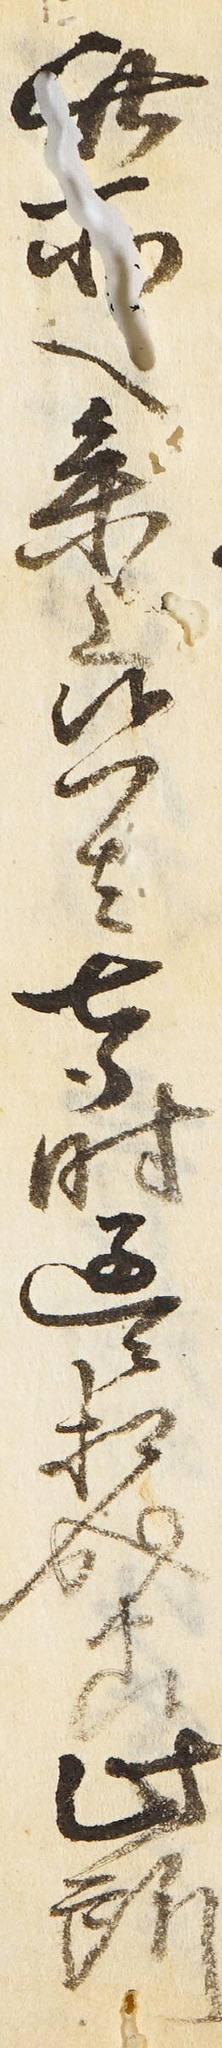此所へ参上候へは七ツ過ニ相成申候此所
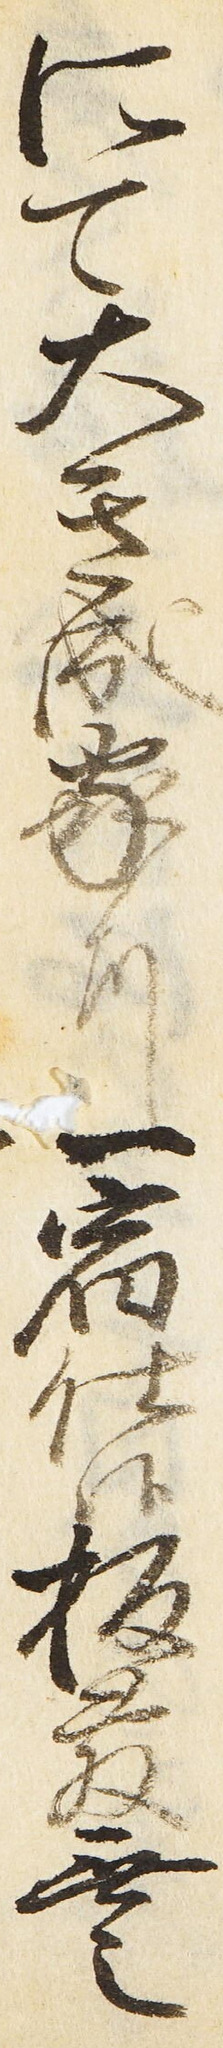にて大き成家に一宿仕候板敷無之
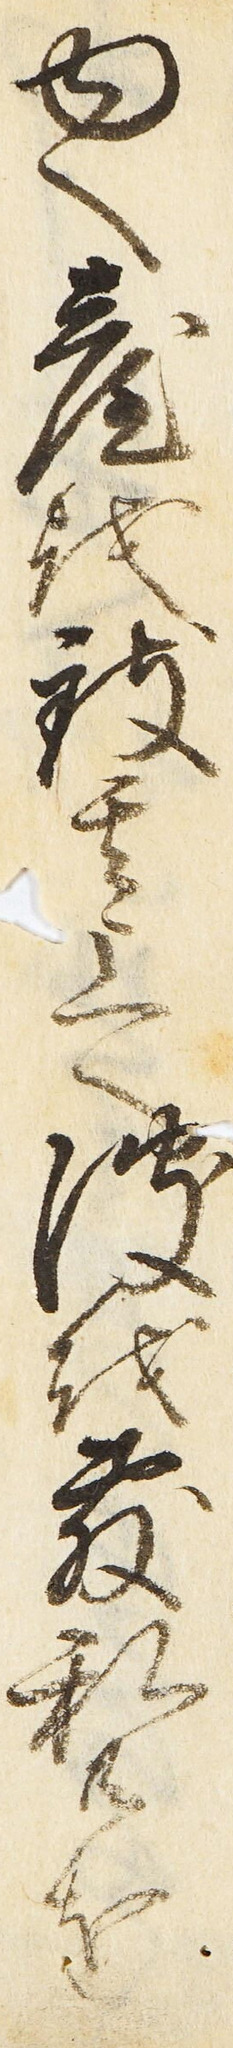ゆへ台を致其上へ皮を敷私共を
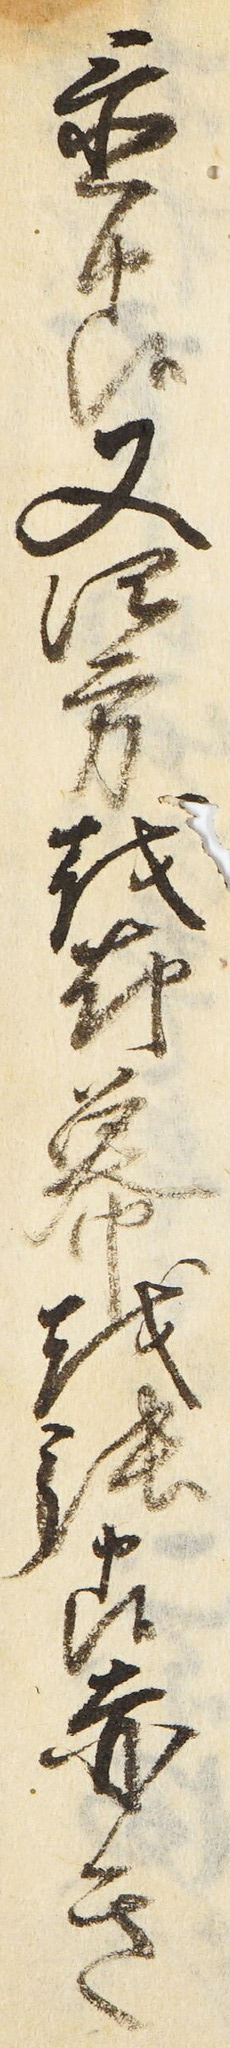置申候又四方を布幕を張申候赤き
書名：志州鳥羽船頭外国江吹流し候一件
